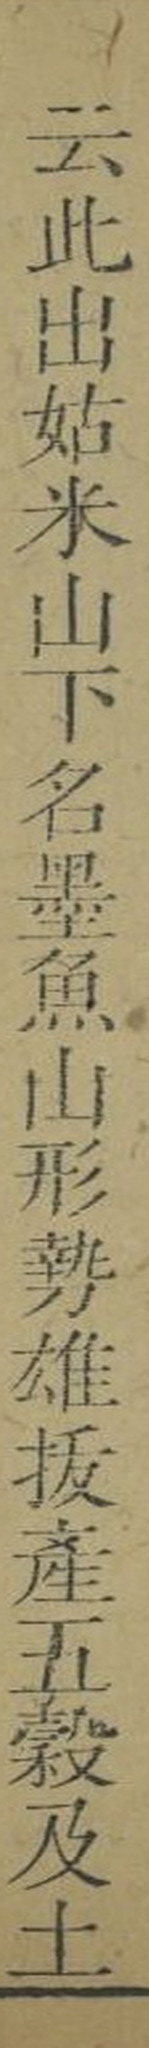云此出姑米山下名墨魚山形勢雄抜産五穀及土
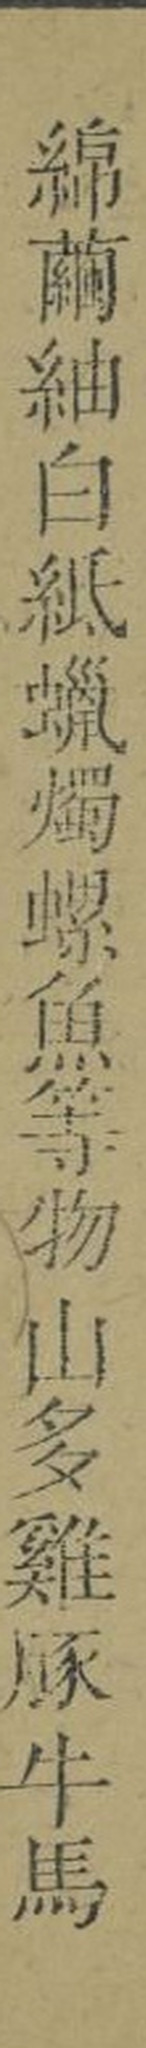綿繭紬白紙蠟燭螺魚等物山多鶏豚牛馬
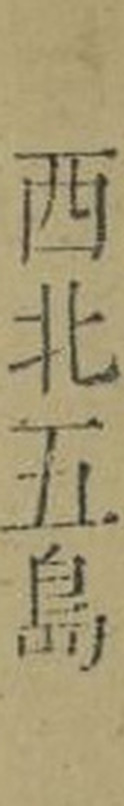西北五島
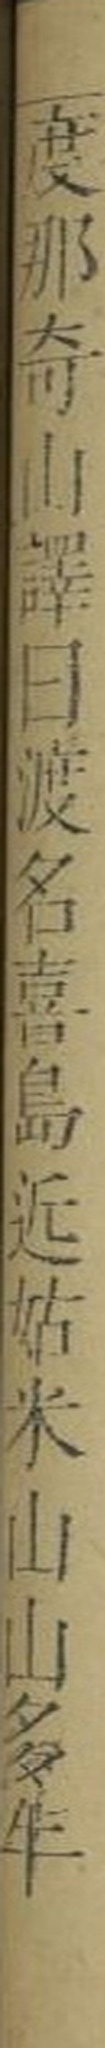[度那奇山]訳曰渡名喜島近姑米山山多牛
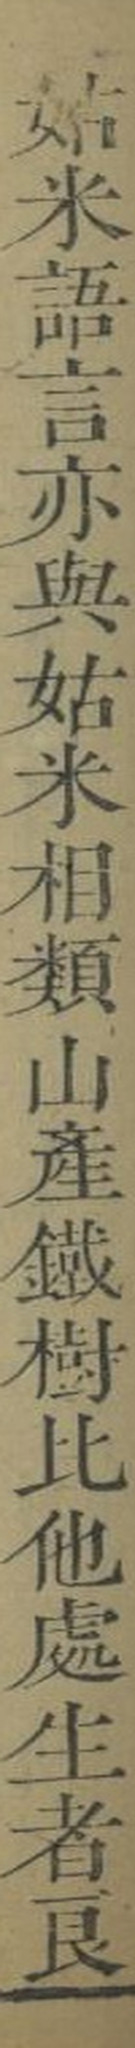姑米語言亦与姑米相類山産鉄樹比他処生者良
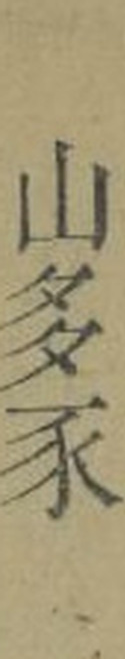山多豕
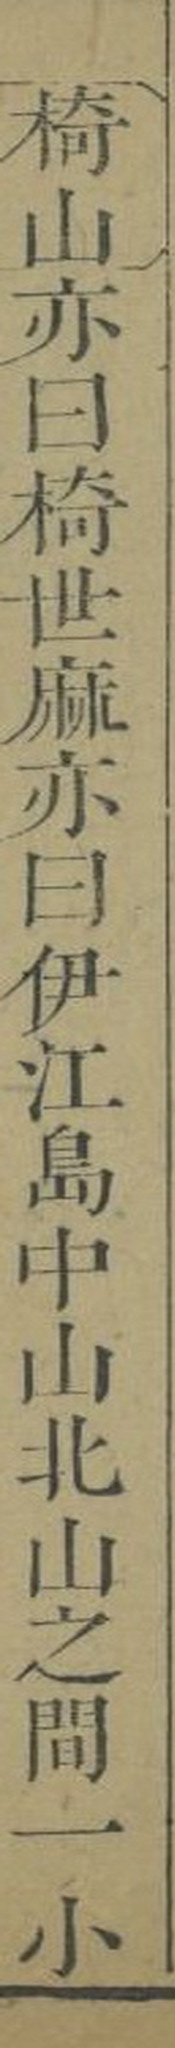[椅山]亦曰椅世麻亦曰伊江島中山北山之間一小
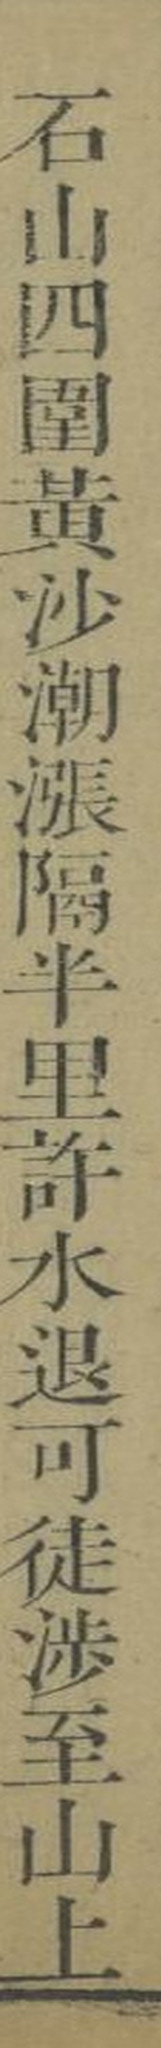石山四囲黄沙潮漲隔半里許水退可徒渉至山上
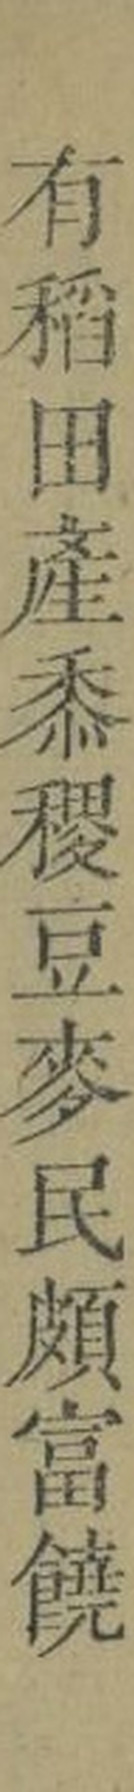有稲田産黍稷豆麦民頗富饒
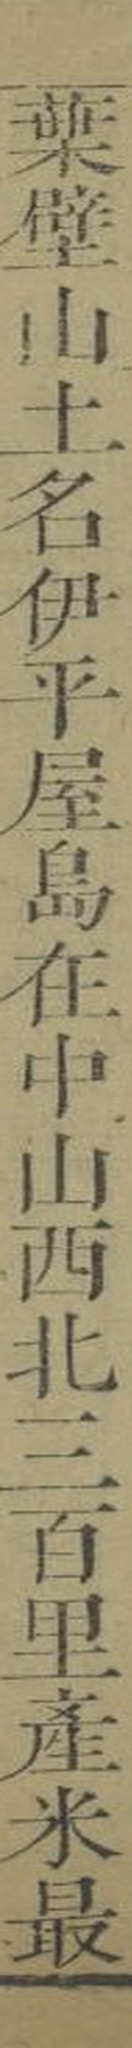[葉壁山]土名伊平屋島在中山西北三百里産米最
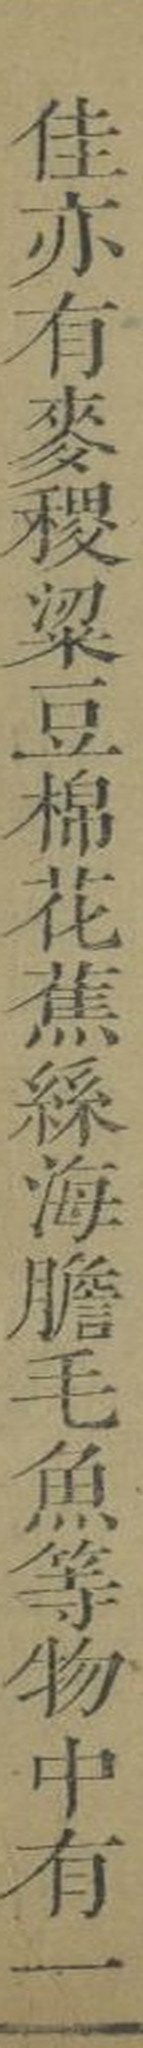佳亦有麦稷粱豆棉花蕉糸海胆毛魚等物中有一
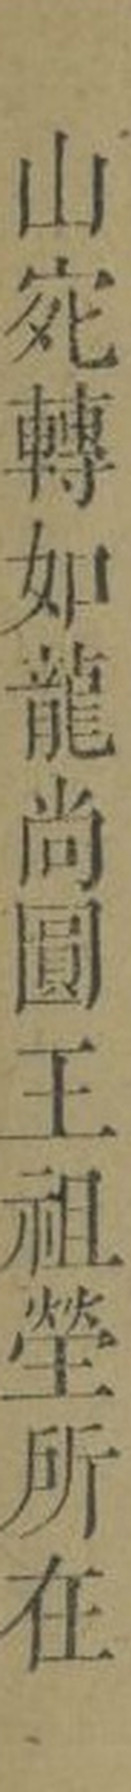山宛転如竜尚円王祖塋所在

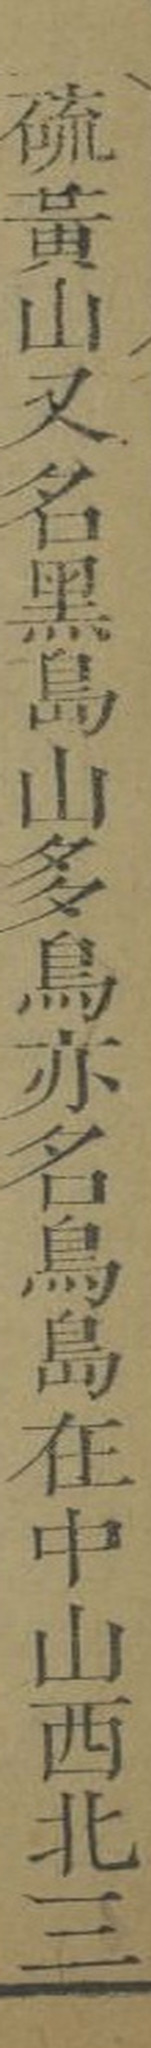[硫黄山]又名黒島山多鳥亦名鳥島在中山西北三
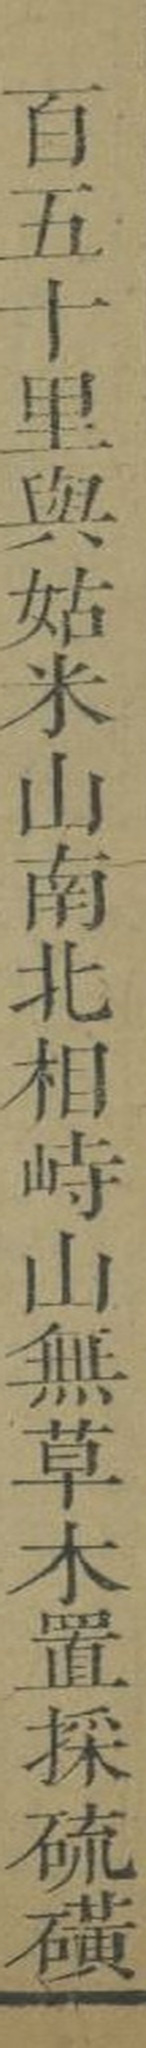百五十里与姑米山南北相峙山無草木置採硫磺
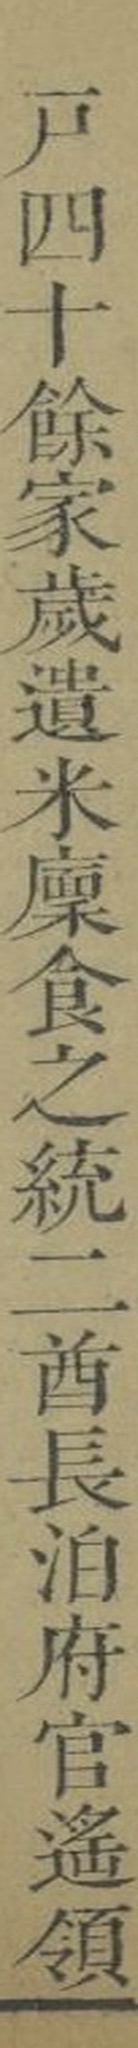戸四十余家歳遺米廩食之統二酋長泊府官遥領
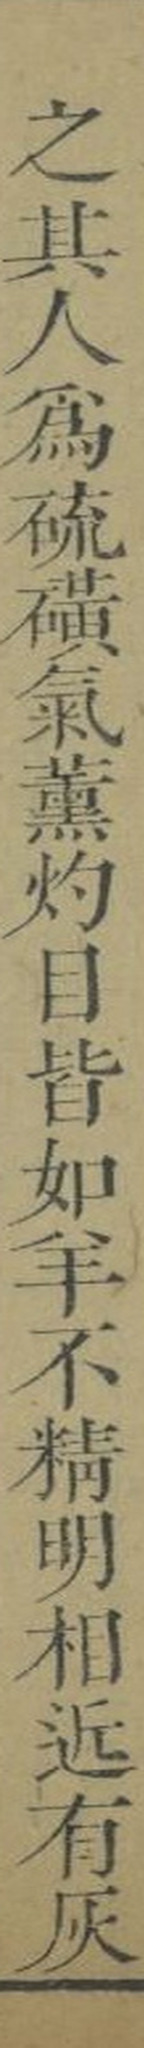之其人為硫磺気薫灼目皆如羊不精明相近有灰
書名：中山伝信録 巻四
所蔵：University of the Ryukyus Library
